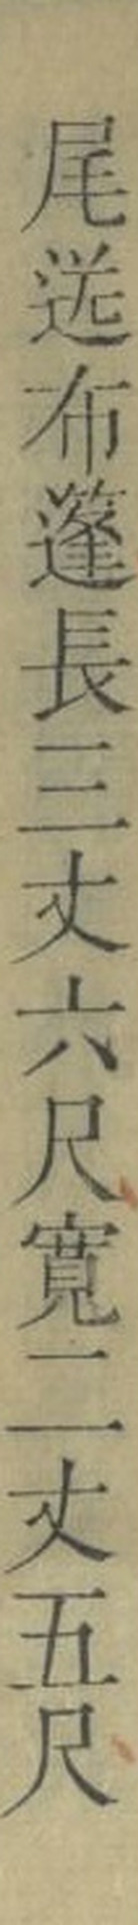尾送布篷長三丈六尺寬二丈五尺
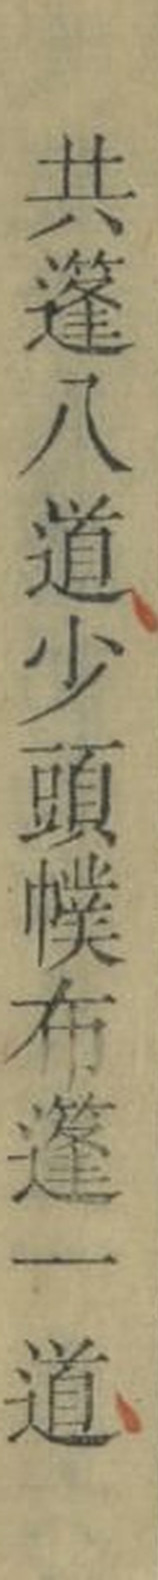共篷八道少頭幞布篷一道
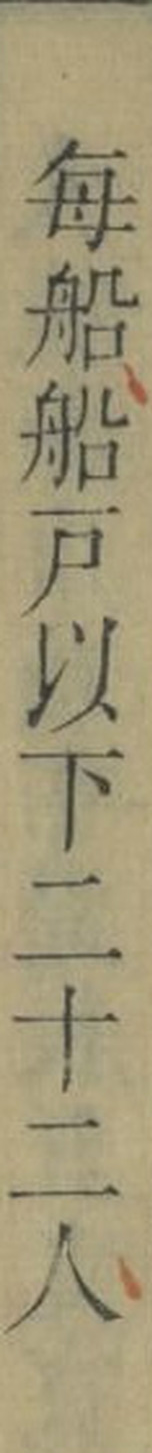每船船戸以下二十二人
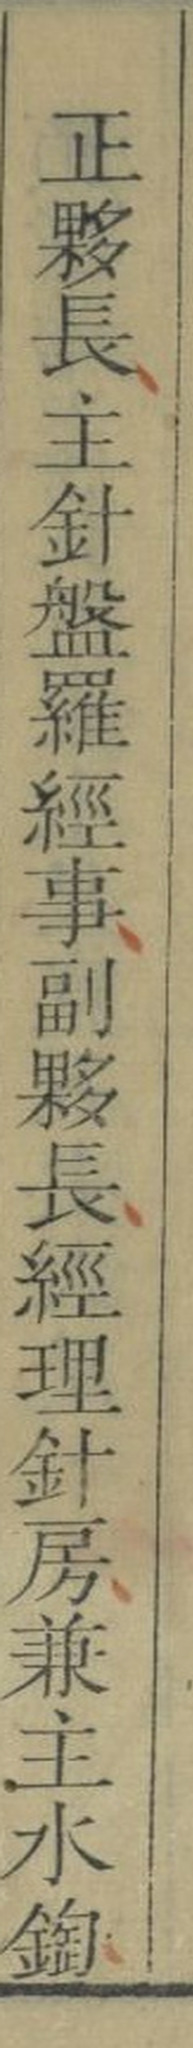正夥長主針盤羅經事副夥長經理針房兼主水鋾
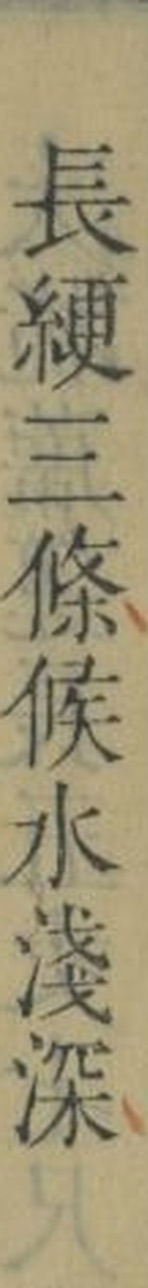長綆三條候水淺深
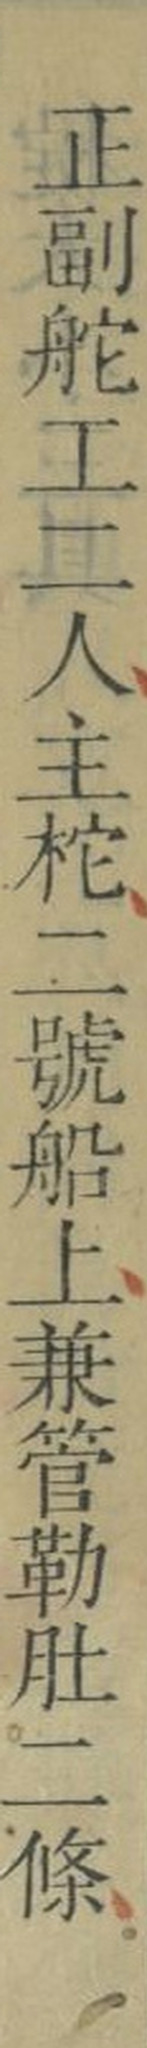正副舵工二人主柁二號船上兼管勒肚二條
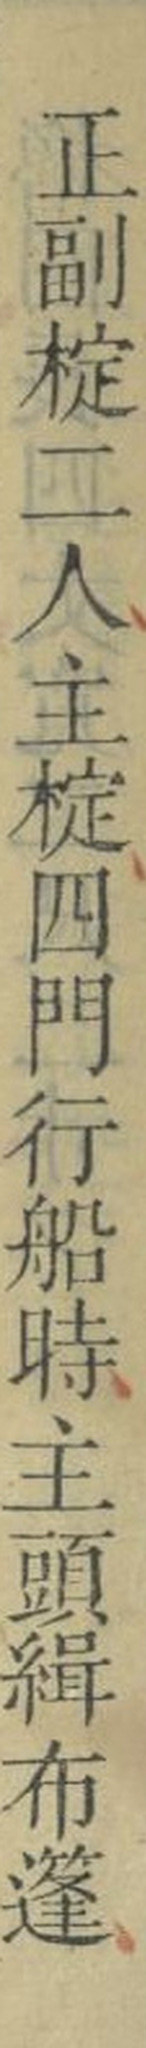正副椗二人主椗四門行船時主頭緝布篷
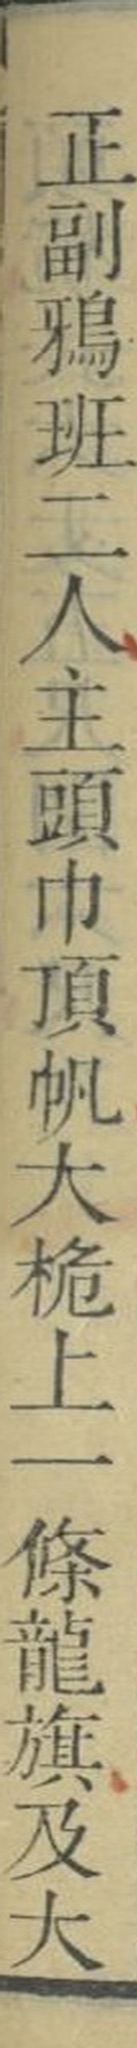正副鴉班二人主頭巾頂帆大桅上一條龍旗及大
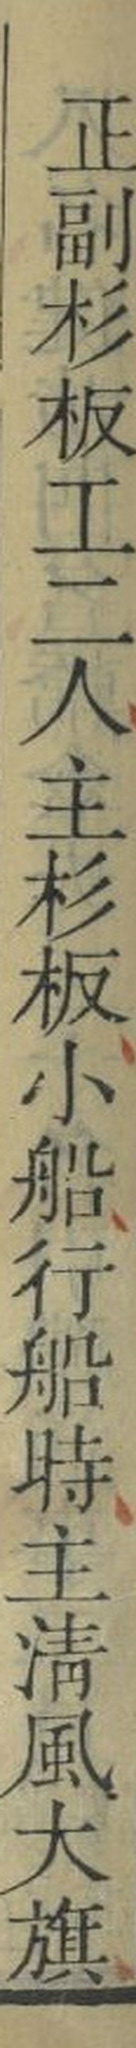正副杉板工二人主杉板小船行船時主淸風大旗
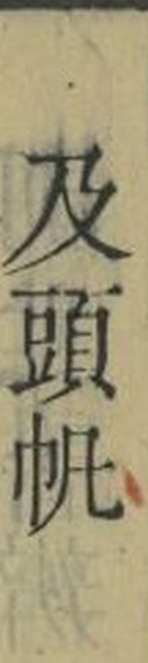及頭帆
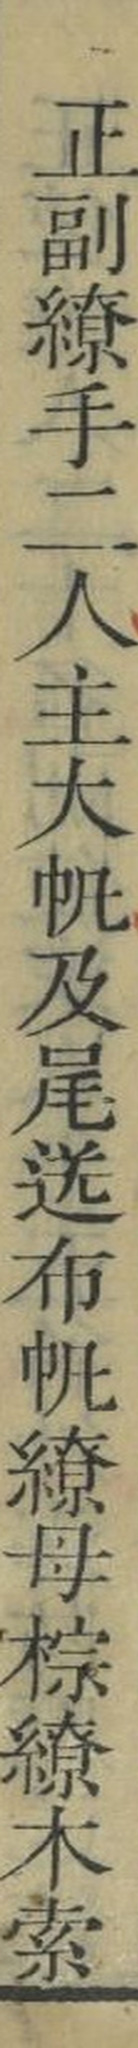正副繚手二人主大帆及尾送布帆繚母棕繚木索
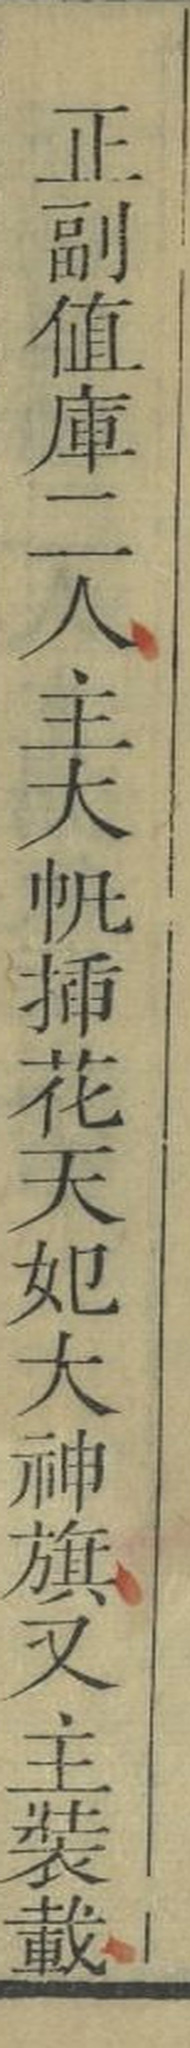正副値庫二人主大帆揷花天妃大神旗又主裝載
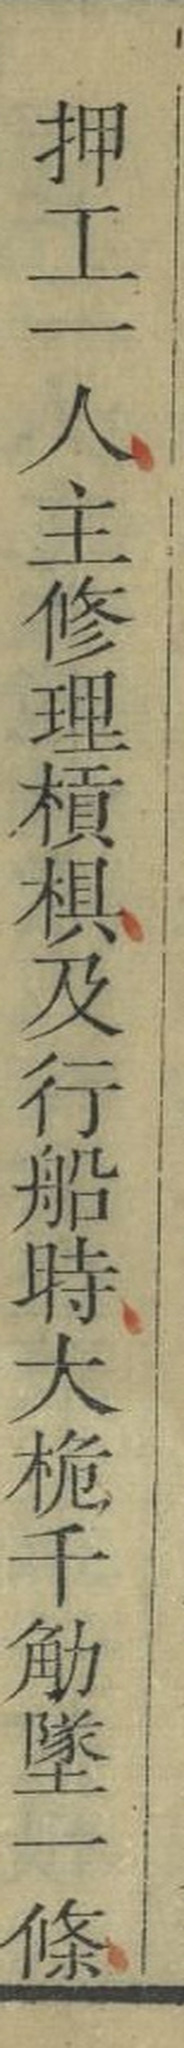押工一人主修理槓椇及行船時大桅千觔墜一條
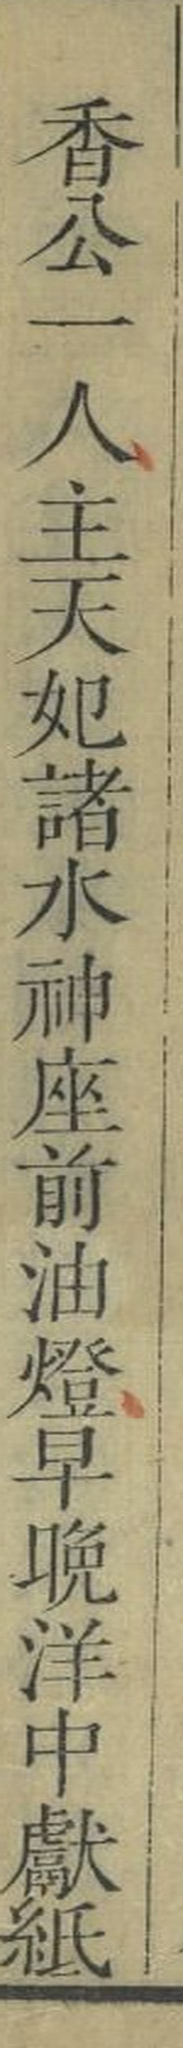香公一人主天妃諸水神座前油燈早晩洋中獻紙
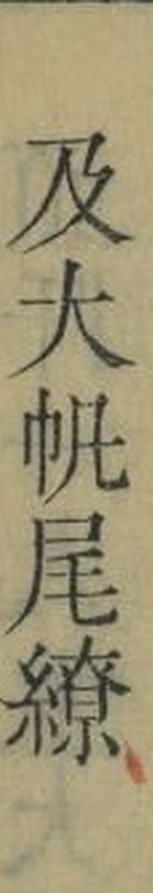及大帆尾繚

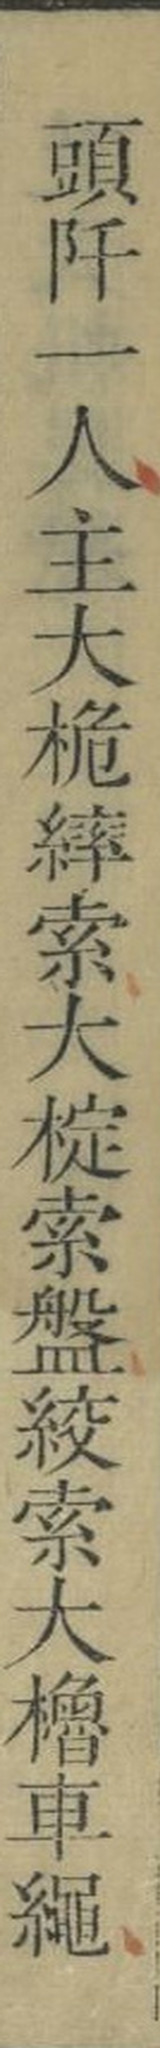頭阡一人主大桅繂索大椗索盤絞索大櫓車繩
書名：中山伝信録 巻一、巻二
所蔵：University of the Ryukyus Library
